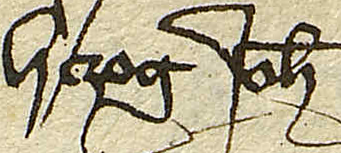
h*cʒog Ioh*
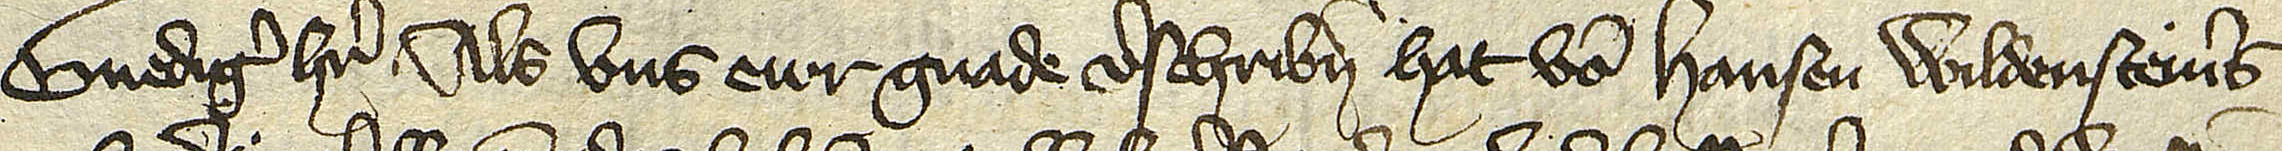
Gnedig* hr* / Als vns ewr gnade v*ſchribn* hat vo* hanſen Wildenſtein*s
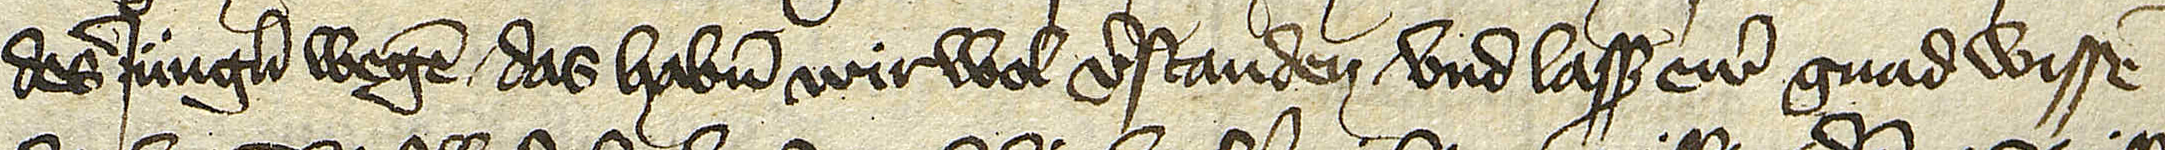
des Iüngn* wege* / das habn* wir wol v*ſtanden / vnd laſſ* ew* gnad wiſſe*
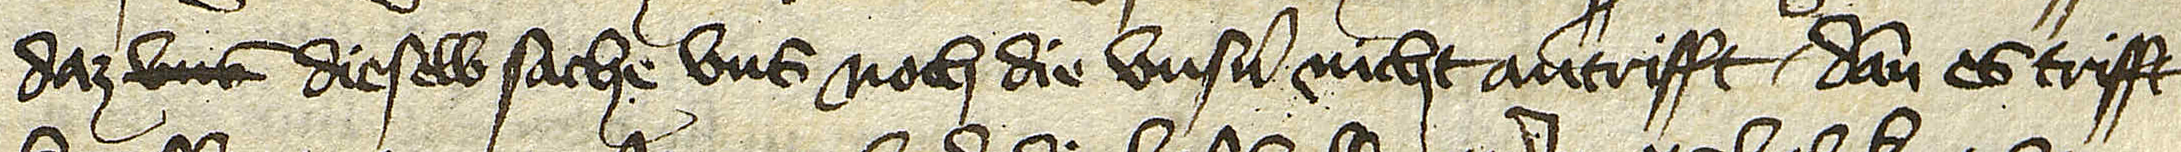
daʒ vns diſelb ſache vns noch die vnſn* nicht antrifft / dan* es trifft
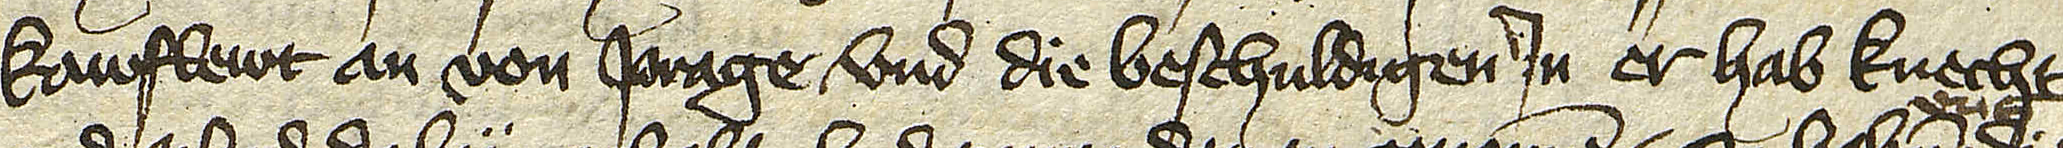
kawflewt an von Prage / vnd die beſchuldigen In er hab knecht
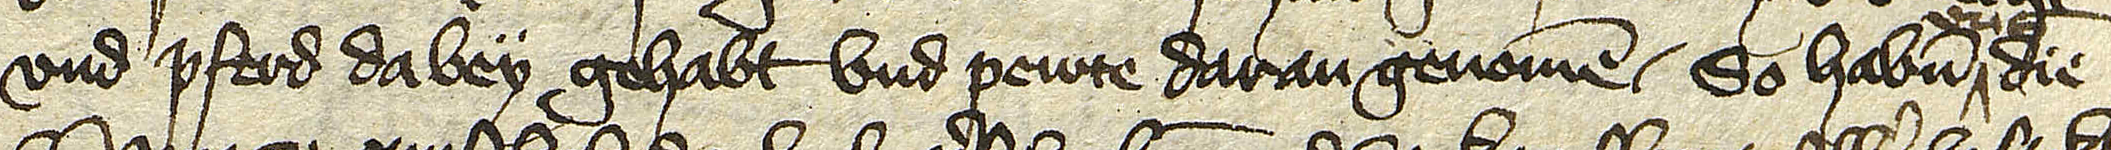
vnd pferd dabey gehabt vnd pewte daran genome* / So habn* die
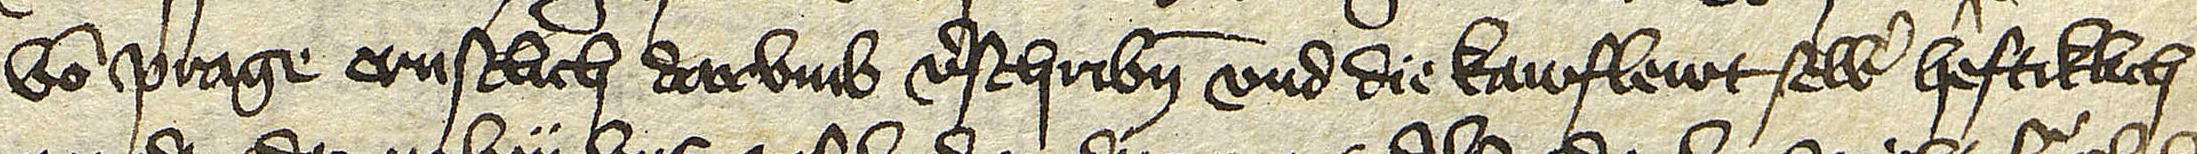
vo* Prage ernſtlich darvmb v*ſchribn* vnd die kawflewt ſelb* heftiklich
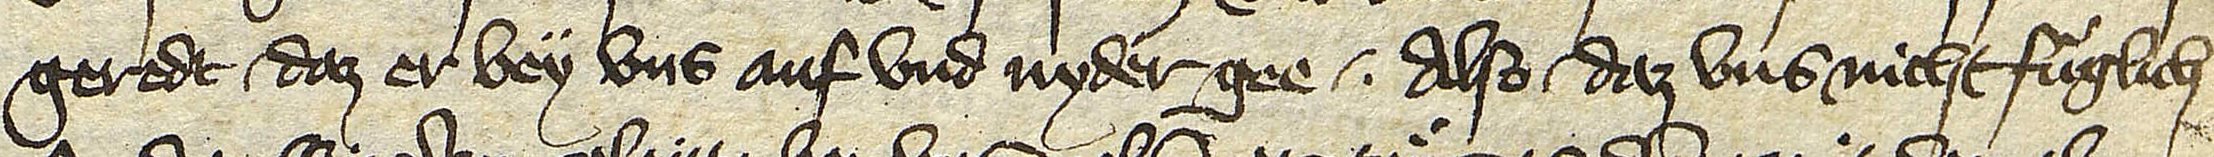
geredt / daʒ er bey vns auf vnd nyder gee / . Alſo / daʒ vns nicht füglich
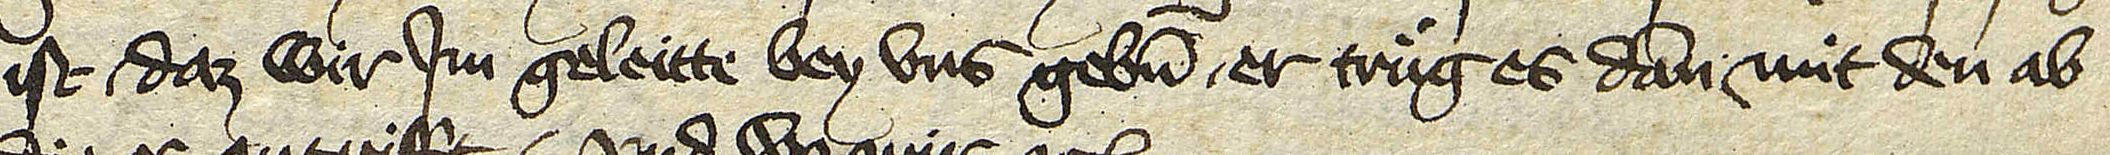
iſt / daʒ wir Im geleitte bey vns gebn* / er trüg es dan* mit den ab
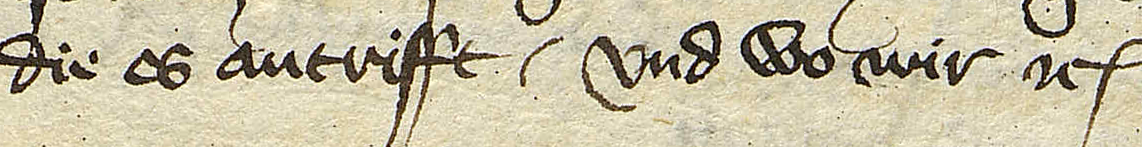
die es antrifft / vnd wo wir ec*
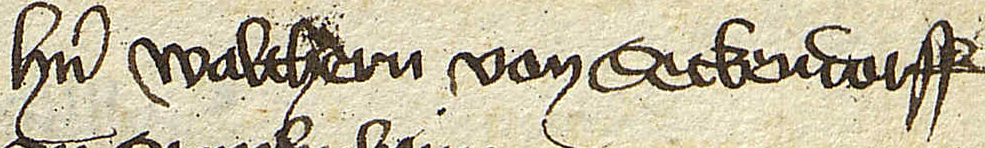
hn* Walthern von Seckendorff
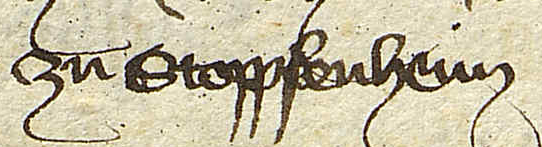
cʒu Stoppfenheim
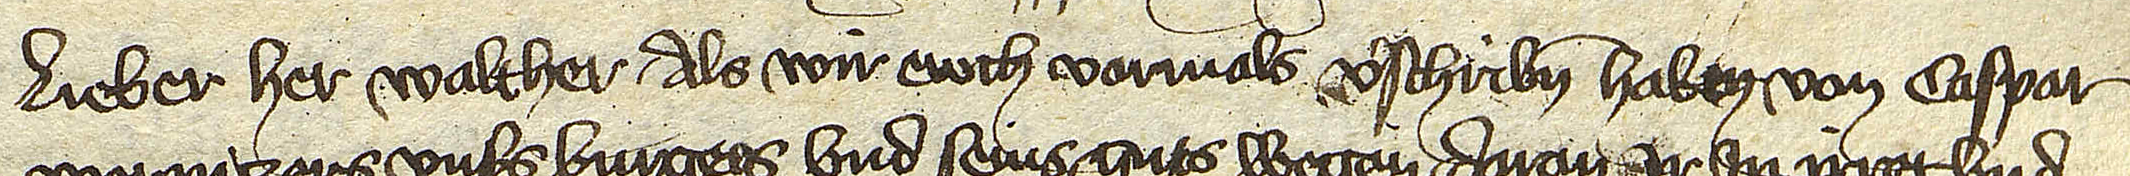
Lieber her Walther / Als wir ewch vormals v*ſchribn* haben von Caſpar
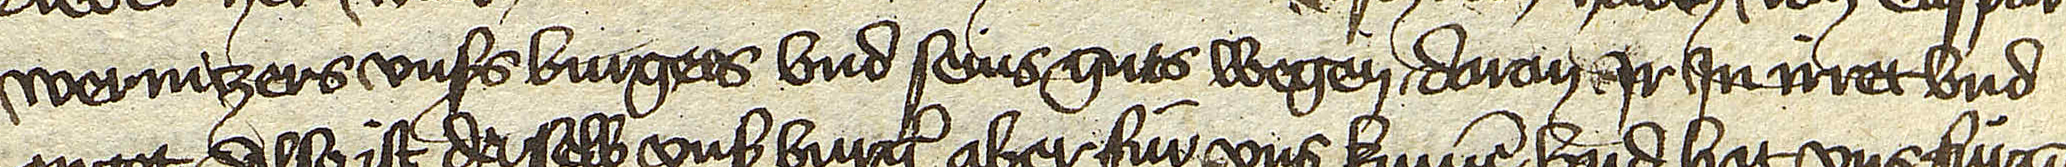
Wernicʒers vnſ*s burgers vnd ſeins guts wegen / daran Ir In irret vnd
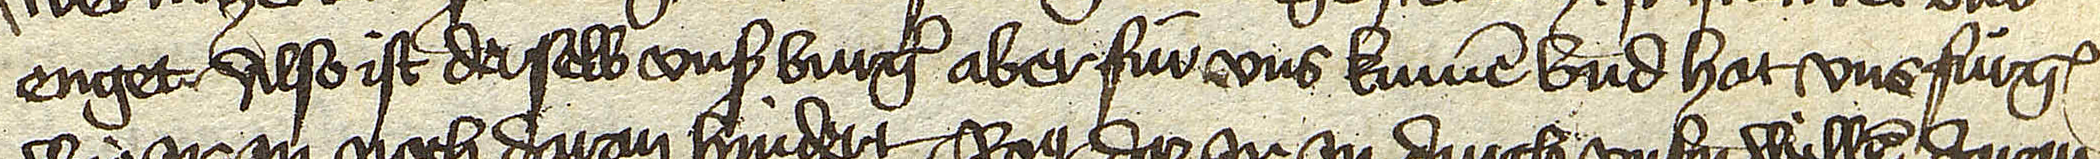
enget / Alſo iſt derſelb vnſ* burg* aber für vns kume* vnd hat vns fürg*
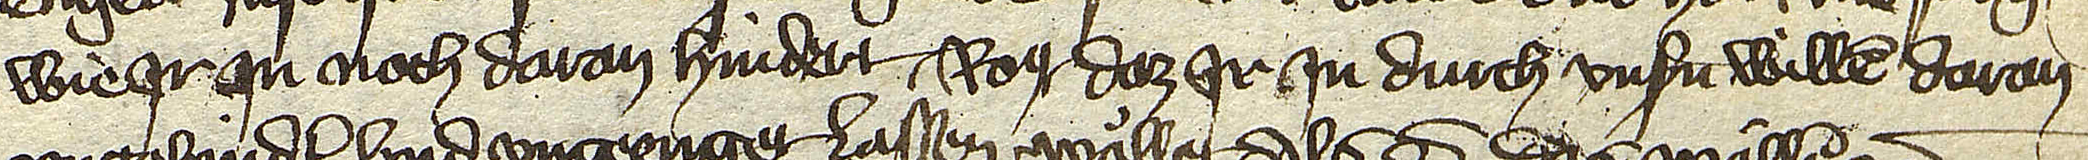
wie Ir In noch daran hindert / Ro* / daʒ Ir In durch vnſ*n wille* daran
